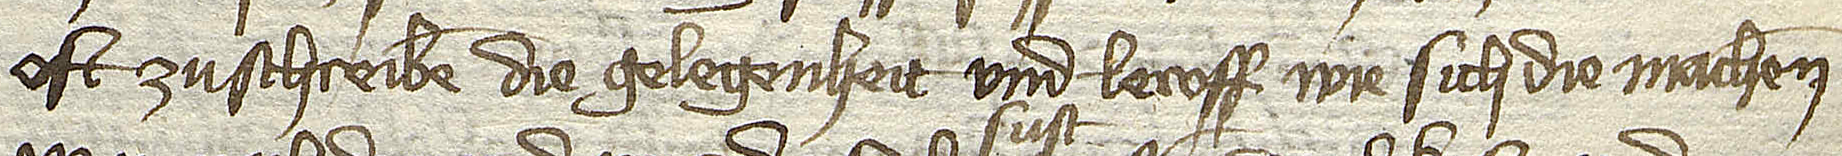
oft ʒuſchreibe* die gelegenheit vnd lewff wie ſich die machen*
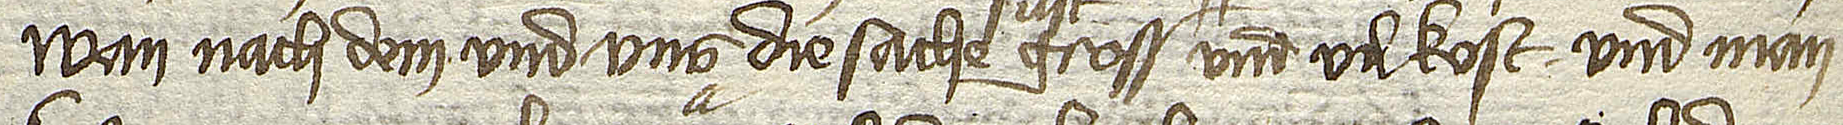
Wan nach dem vnd vns die ſache groſſ vnd vil koſt . vnd man
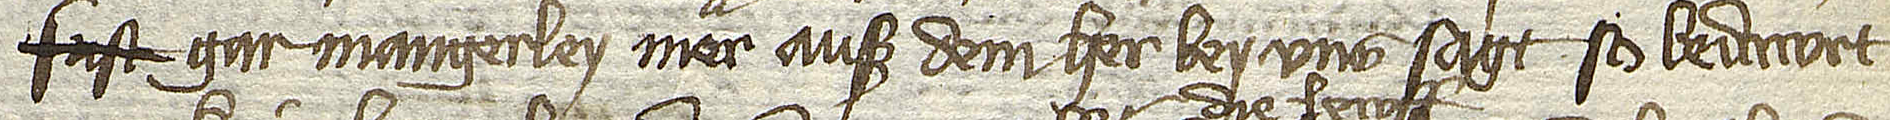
ſuſt gar mangerley mër auſʒ dem her bey vns ſagt ſo bedawrt
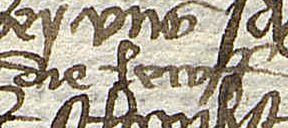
die lewff
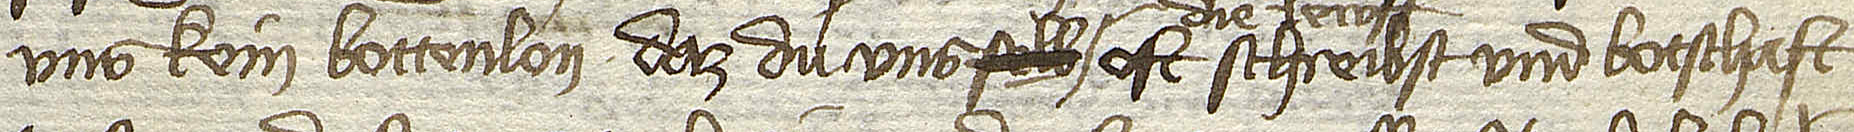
vns kein bottenlon . daʒ du vns ſelb oft ſchreibſt vnd botſchaft
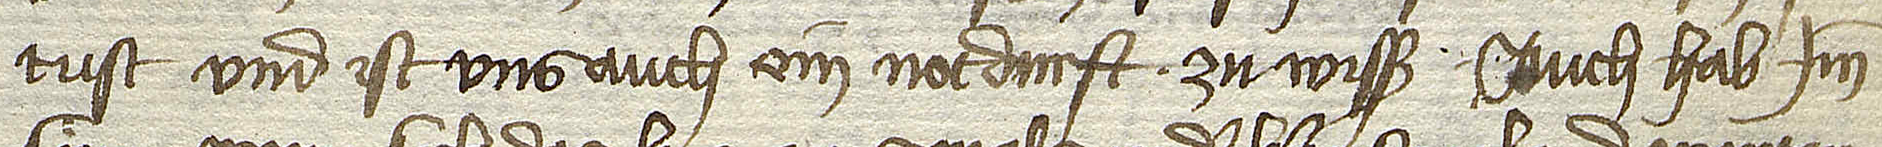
tuſt vnd iſt vns auch ein notdurft . ʒu wiſſ* Auch hab Im*
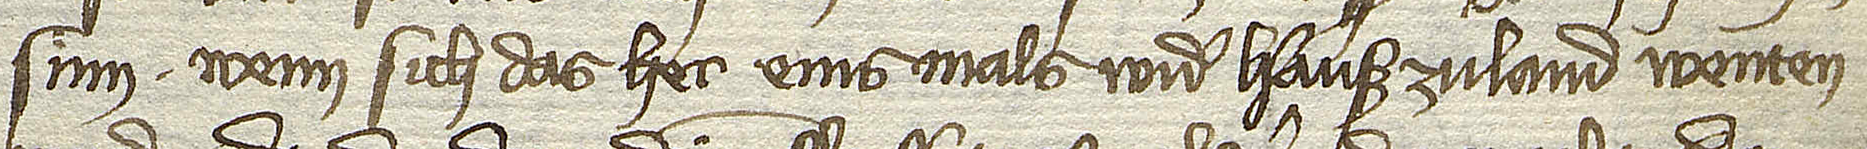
ſinn . wenn ſich das her eins mals wid* h*auſʒ ʒuland wenten
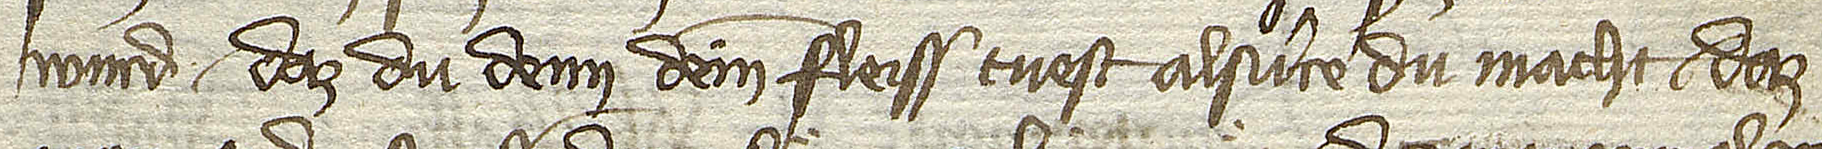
wurd* / daʒ du denn dein* fleiſſ tueſt alſu*re du macht / daʒ
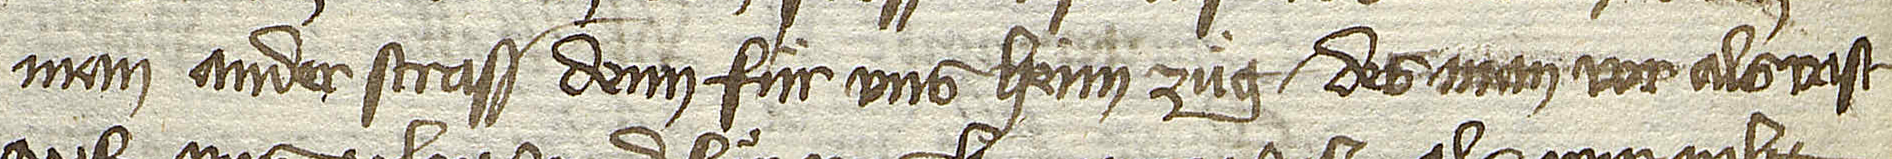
man ander ſtraſſ denn für vns heim ʒüg / des man vor als vaſt
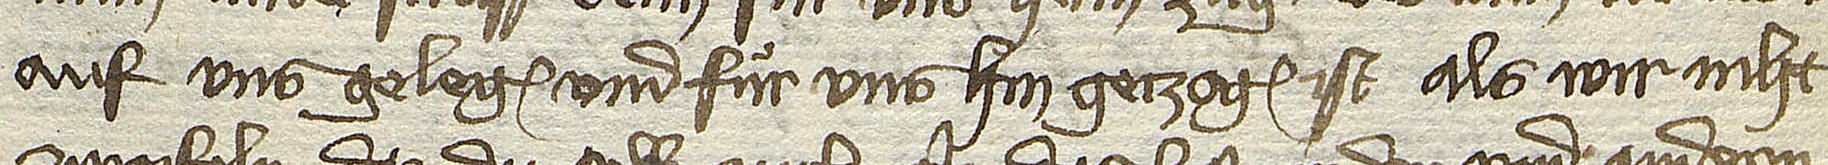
auf vns geleg* vn für vns hin gecʒog* iſt als wir niht
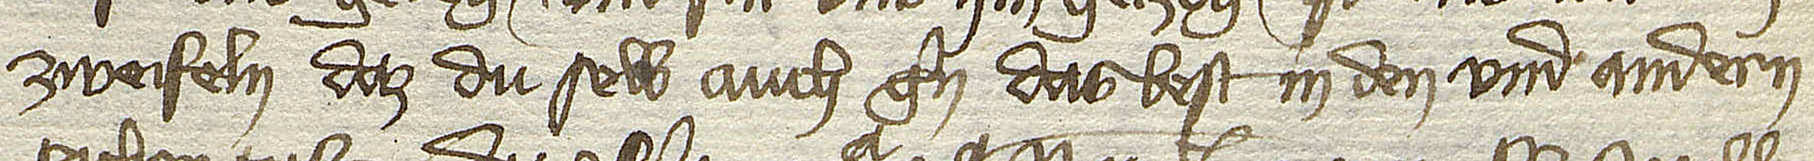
ʒweifeln daʒ du ſelb auch gn* das beſt in den vnd andern
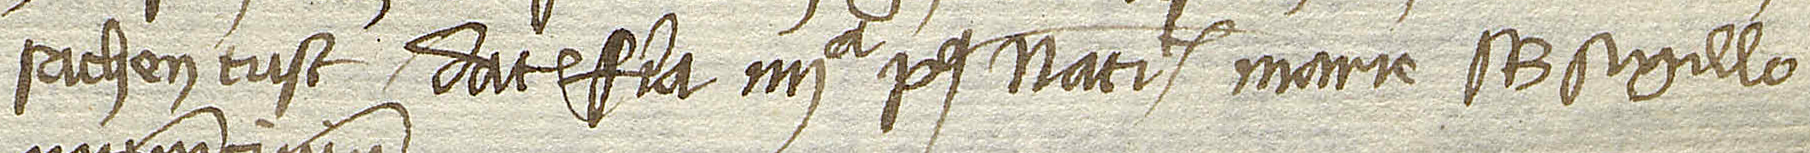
ſachen tuſt / dat* fia* iiii* p* Nati* marie ſB* ſigillo
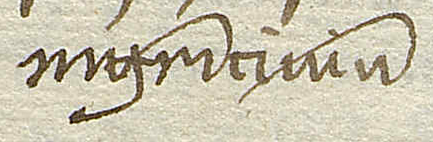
mg*riciuiu*
